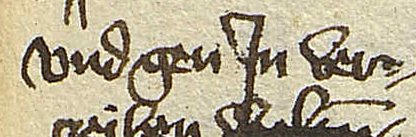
vnd gen In ver =
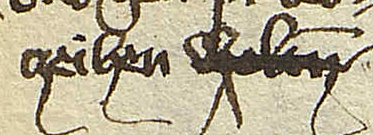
cʒeihen woltn* /
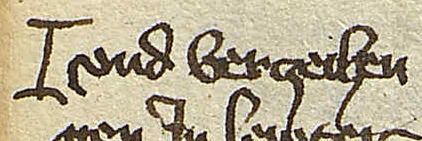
vnd vercʒeihen
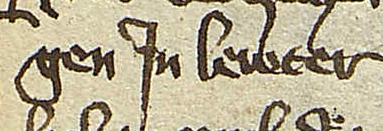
gen In lewter
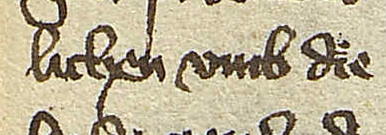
lichen vmb die
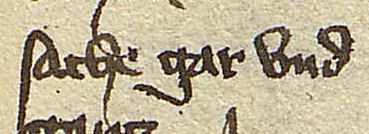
ſache gar vnd
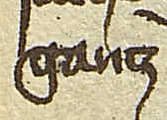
gancʒ
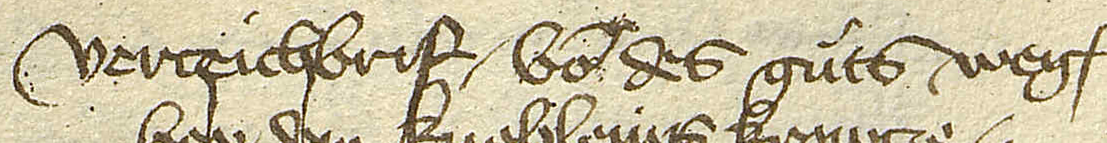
vercʒeichbrif / vo* des güts weg*
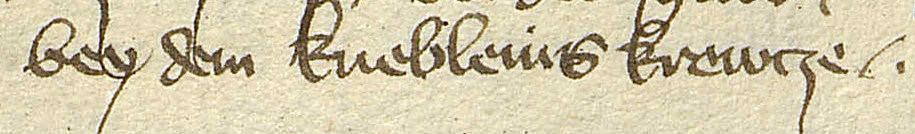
bey dem knebleins krewcʒe / .
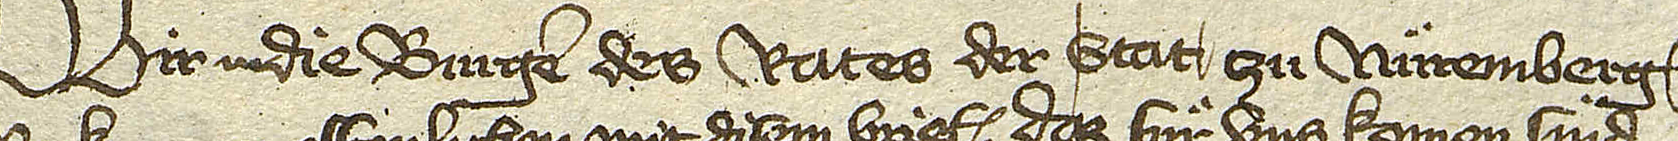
Wir ~ die Burge* des Rates der Stat cʒu Nüremberg*
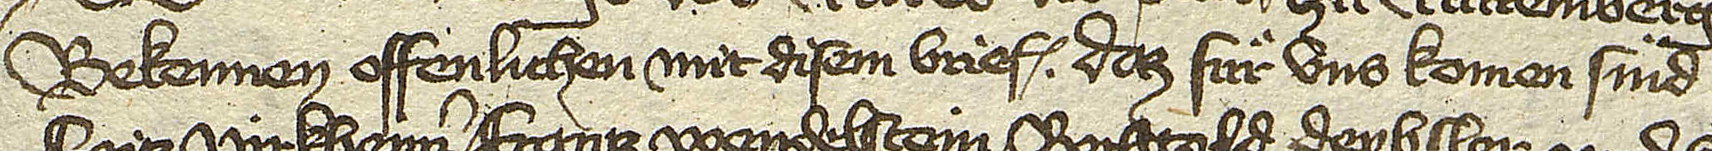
Bekennen offenlichen mit diſem brief* . daʒ für vns komen ſind
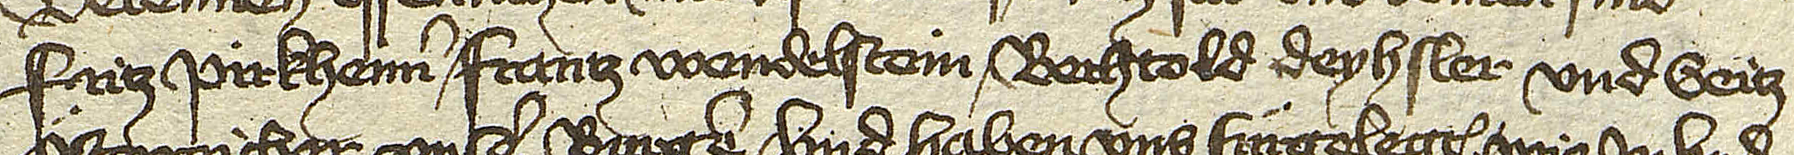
Fricʒ Pirkheim* / Francʒ wendelſtein / Bertold deyhſler vnd Seicʒ
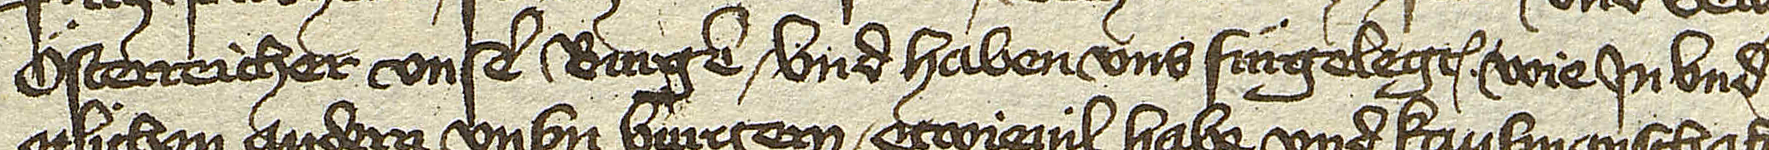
Öſterreicher vnſe* Burge* / vnd haben vns fürgelegt* . wie In vnd
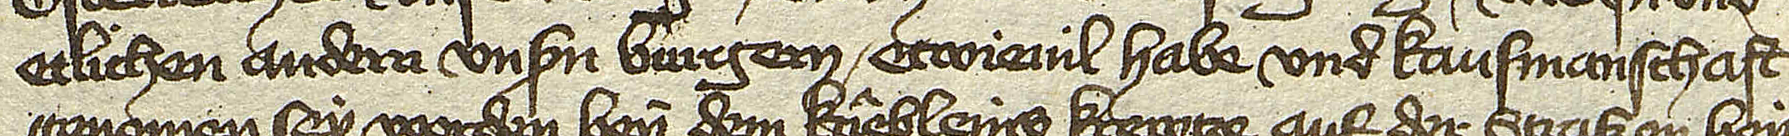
etlichen andern vnſ*n burgern / erwieuil habe vnd kaufmanſchaft
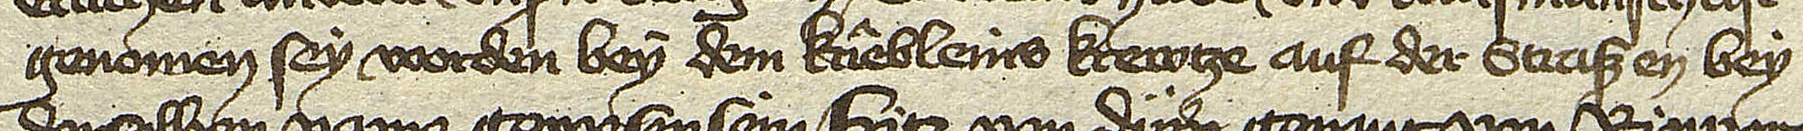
genomen ſey worden bey dem knëbleins krewcʒe auf der Straſʒen bey
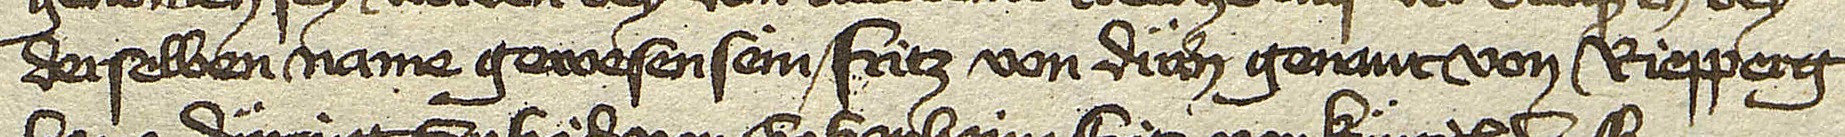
derſelben name geweſen ſein / Fricʒ von dürn genant von Riepperg
